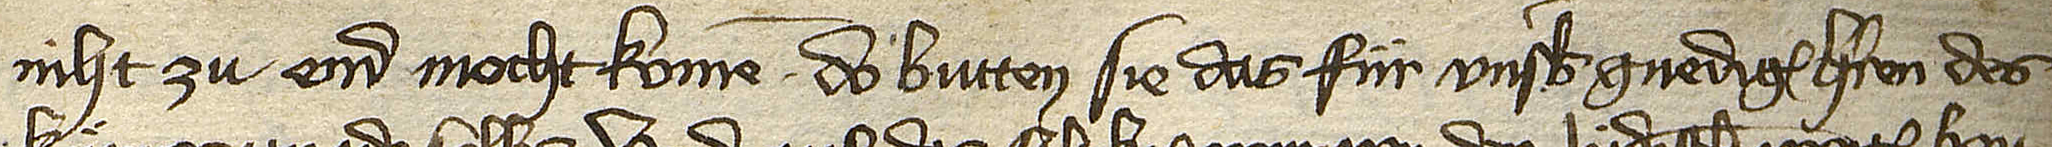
niht ʒu end mocht kome* . Do butten ſie das für vnſ*s gnedig* h*ren des
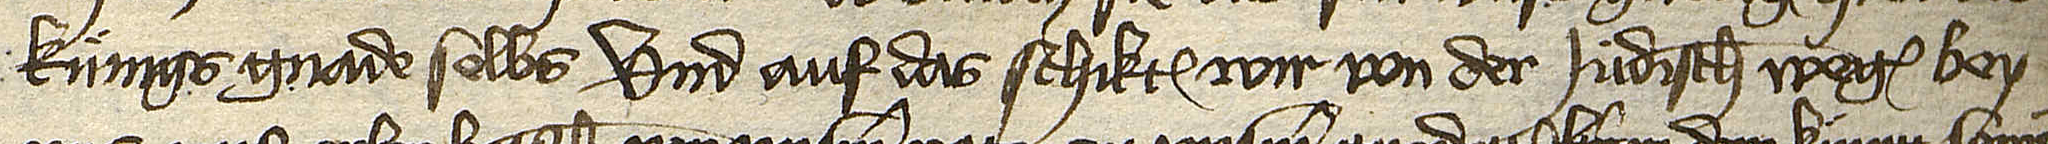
künigs gnade ſelbs Vnd auf das ſchikt* wir von der Iüdiſch* weg* bey
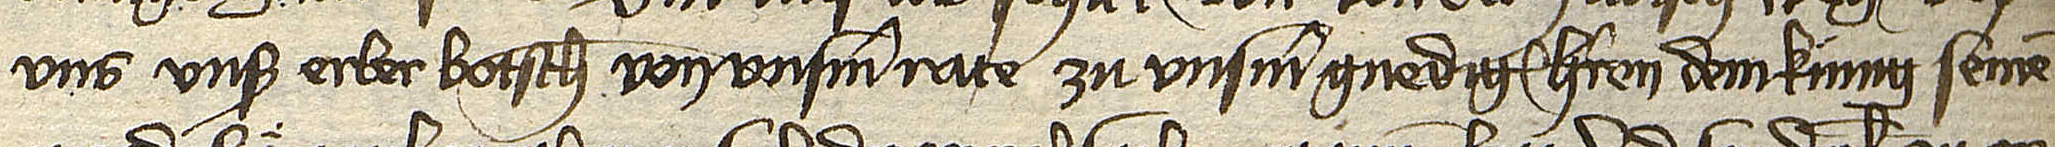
vns vnſ* erber botſch* von vnſm* rate ʒu vnſm* gnedig* h*ren dem künig ſeine*
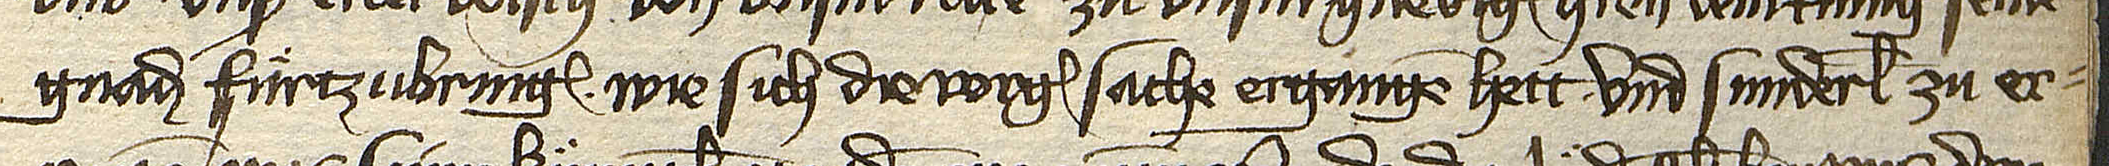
gnad* fürcʒubring* . wie ſich die vorg* ſache ergange* hett / vnd ſunderl* ʒu er =
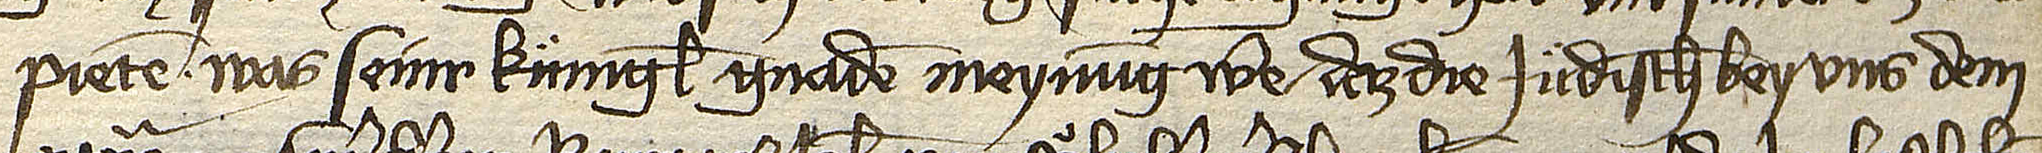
piete* . was ſeinr künigl* gnade* meynu*g w*e / daʒ die Iüdiſch* bey vns dem
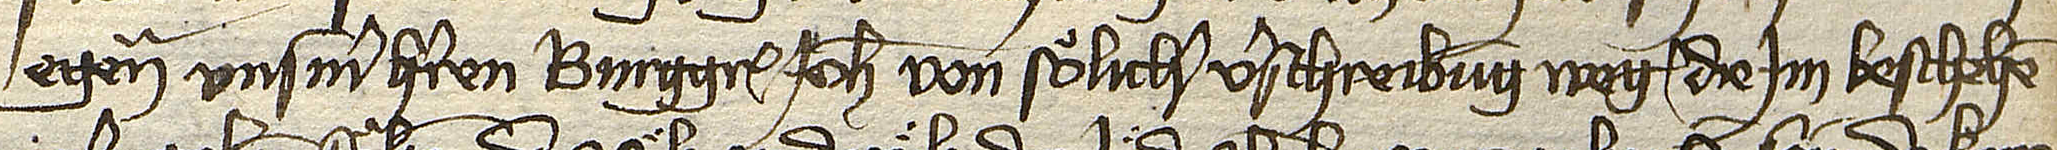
egen* vnſm* h*ren Burggr* Ioh* von ſölich* v*ſchreibu*g weg* die Im beſchehe*
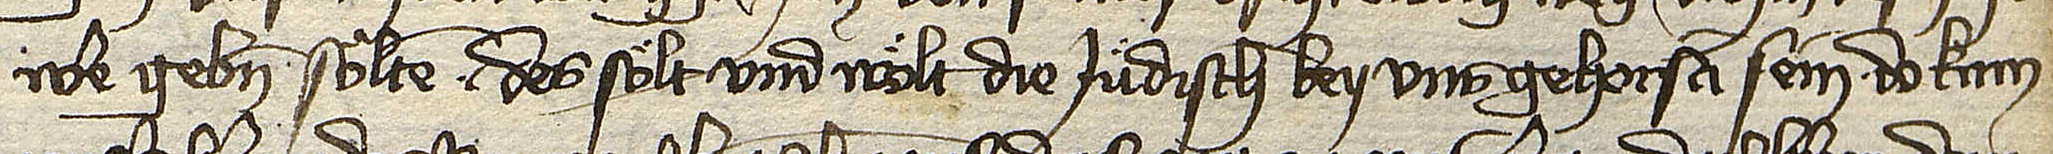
w*e gebn* ſölte* . / Des ſölt vnd wölt die Iüdiſch* bey vns gehorſa* ſein . do kam
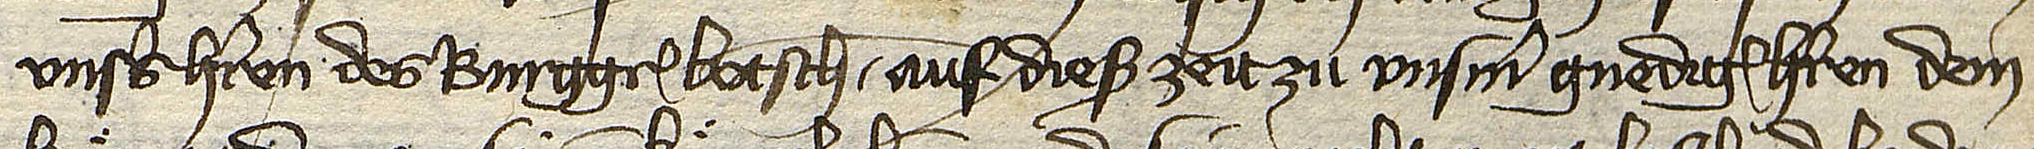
vnſ*s h*ren . des Burggr* botſch* / auf dieſ* ʒeit ʒu vnſm* gnedig* h*ren dem
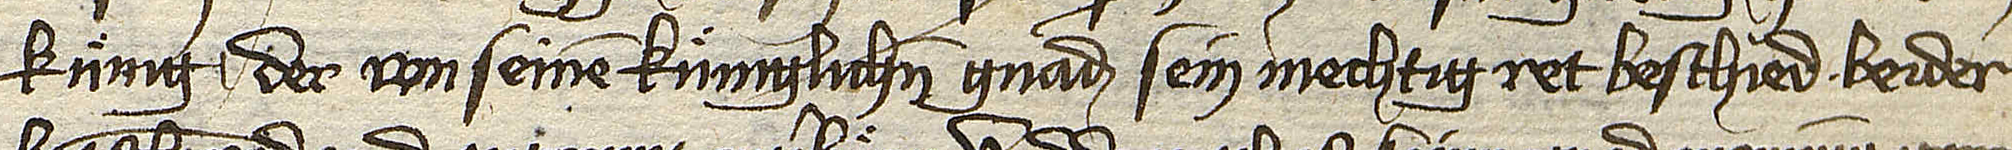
künig / Der von ſeine* küniglichn* gnad* ſein mechtig ret beſchied . beider
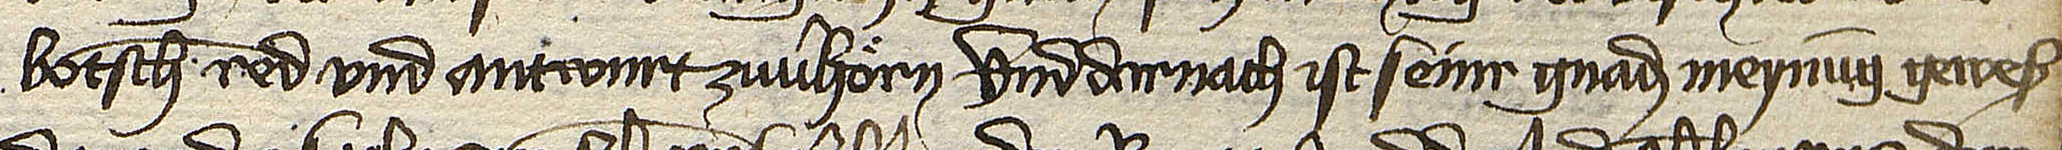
botſch* red vnd antwurt ʒuu*hören Vnd darnach iſt ſeinr gnad* meynu*g geweſ*
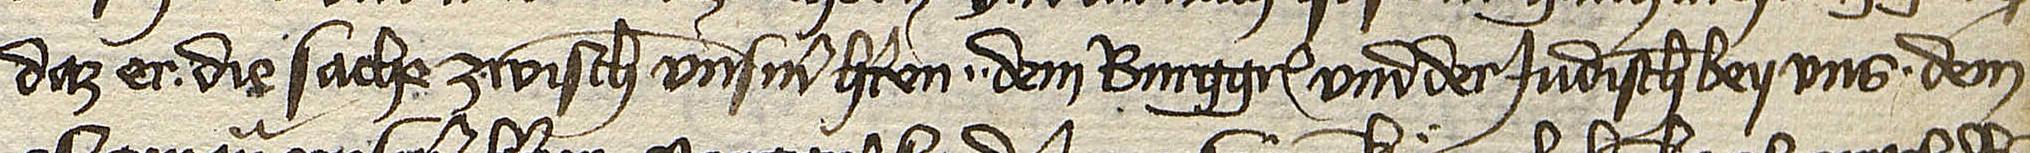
daʒ er die ſache ʒwiſch* vnſm* h*ren ~ dem Burggr* vnd der Iudiſch* bey vns . dem
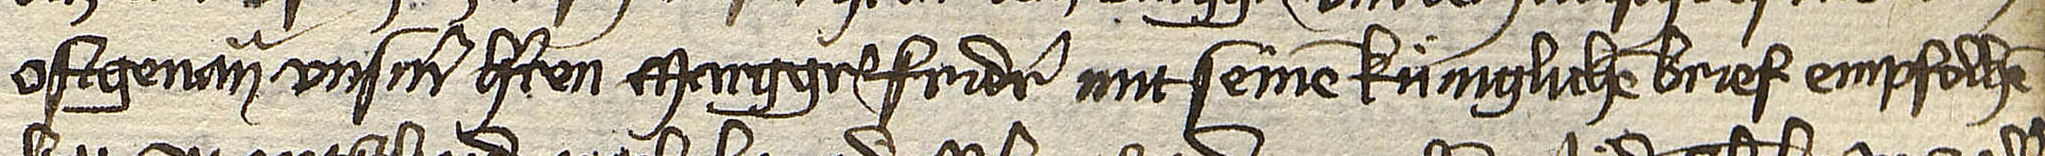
oftgenan* vnſm* h*ren Marggr* Fridr* mit ſeine* künigliche* brief empfolhe*
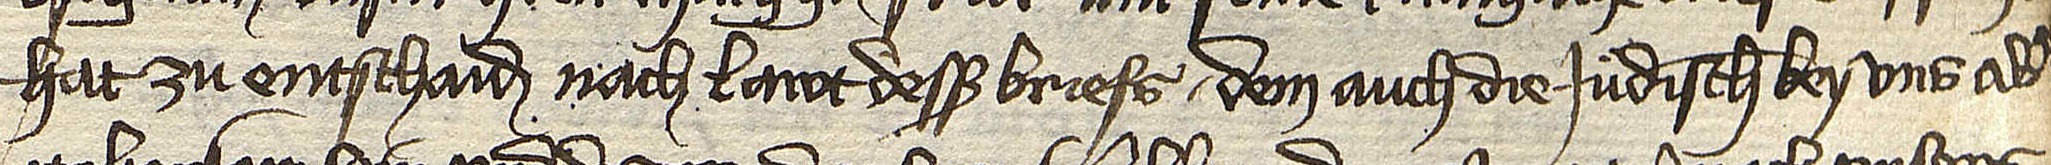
hat ʒu entſchaid* nach lawt deſſ* briefs / Dem auch die Iüdiſch* bey vns ab*
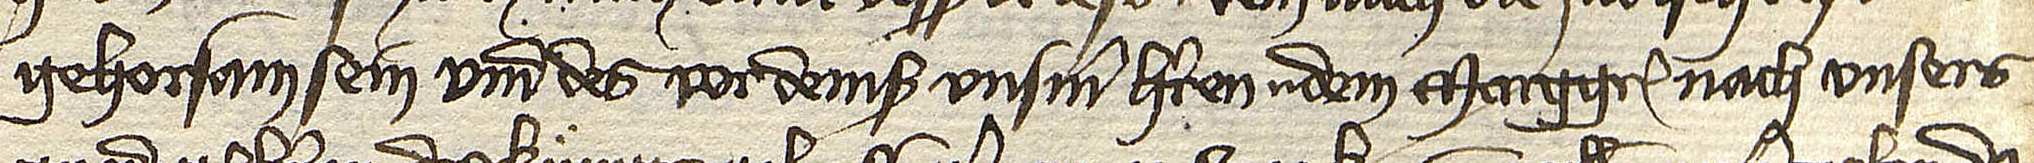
gehorſam ſein vnd des vor demſ* vnſm* h*ren ~ dem Marggr* nach vnſers
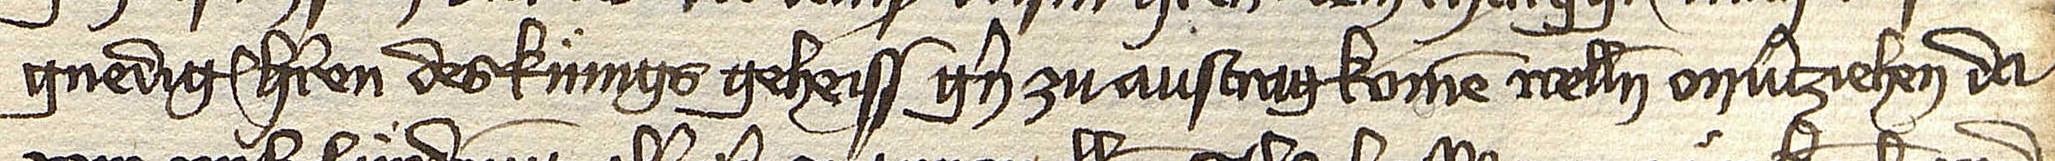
gnedig* h*ren des künigs geheiſſ g*n ʒu auſtrag kome* welln* onu*cʒiehen da
